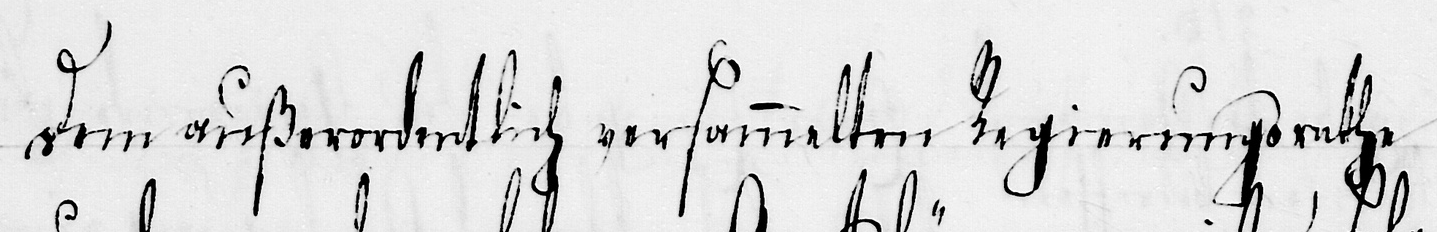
Dem außerordentlich versammelten Regierungsrathe
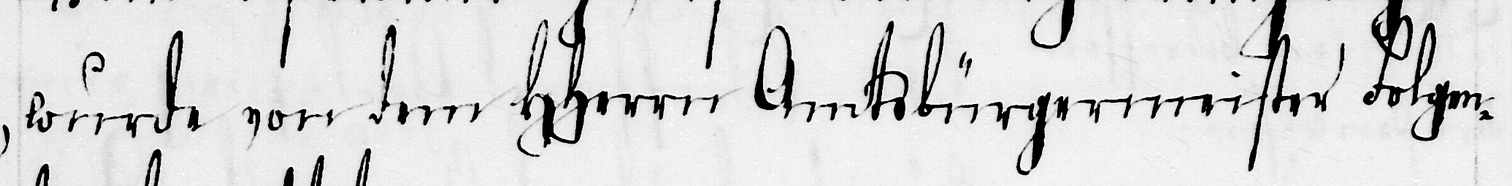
wurde von dem HHerrn Amtsbürgermeister Folgen¬
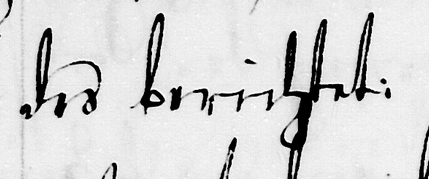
des berichtet:
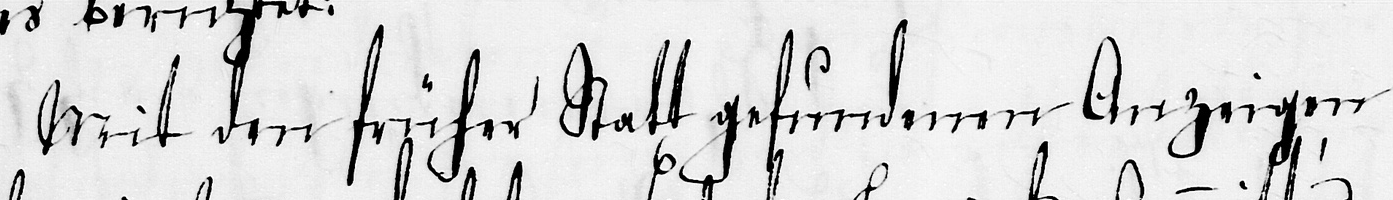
Mit den früher Statt gefundenen Anzeigen
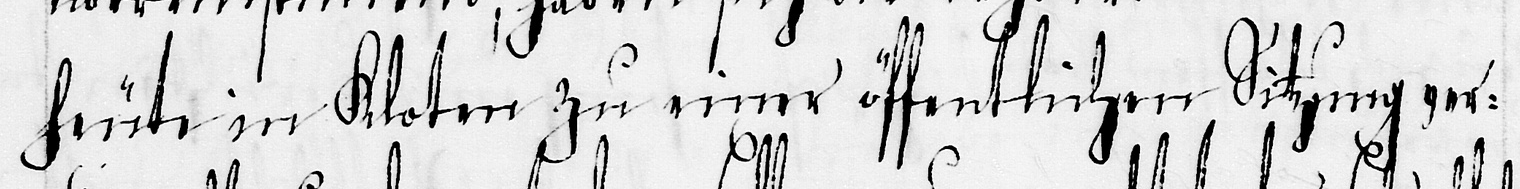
heute in Kloten zu einer öffentlichen Sitzung ver¬
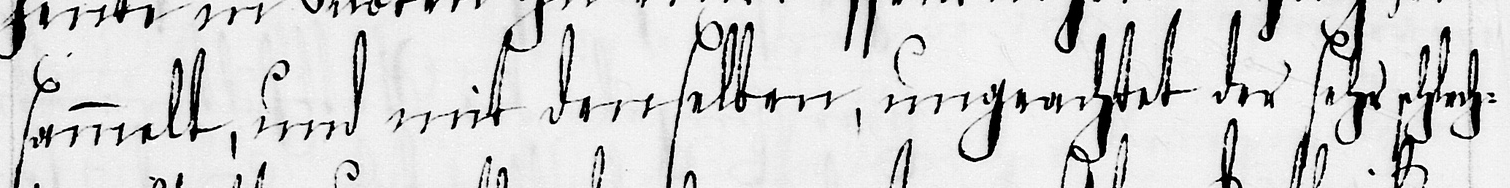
sammelt, und mit denselben, ungeachtet der sehr sc¬
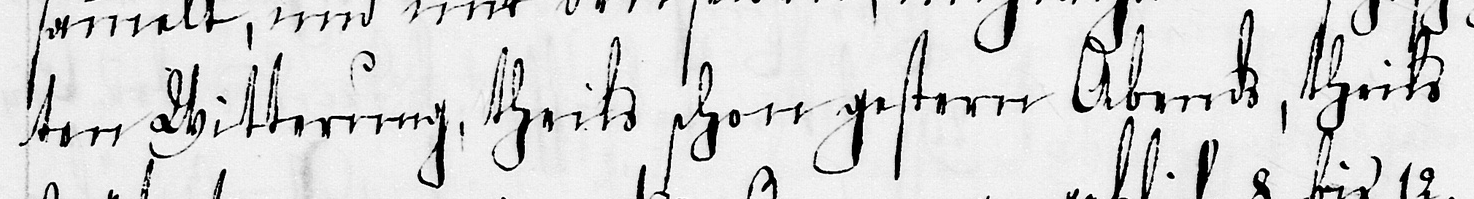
hten Witterung, theils schon gestern Abends, theils
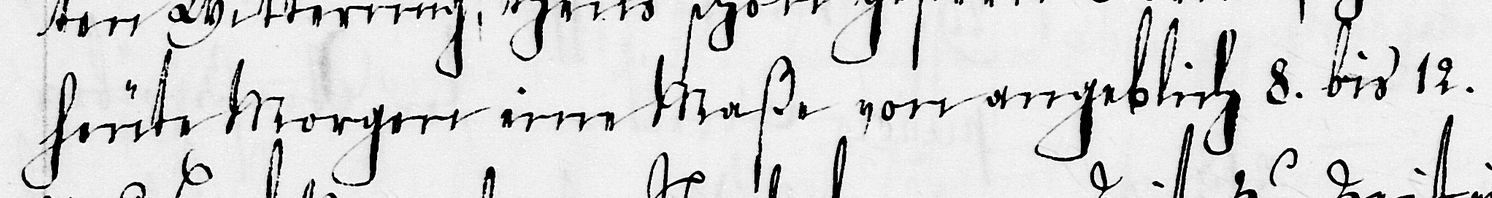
heute Morgen eine Maße von angeblich 8. bis 12.
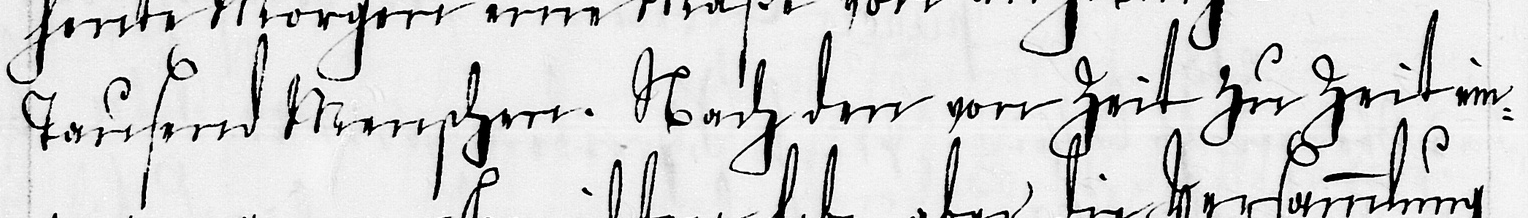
Tausend Menschen. Nach den von Zeit zu Zeit ein¬
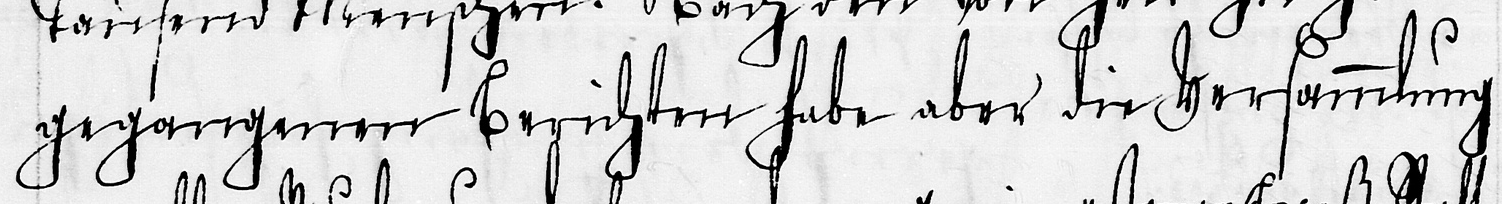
gegangenen Berichten habe aber die Versammlung
